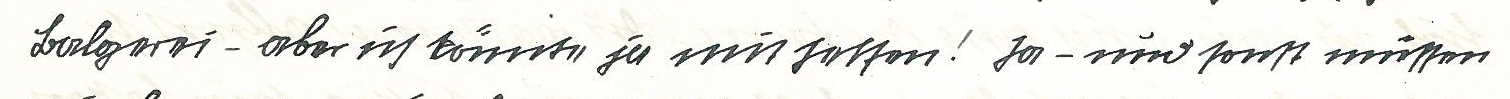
Balgerei – aber ich könnte ja mit helfen! Ja – und sonst müssen
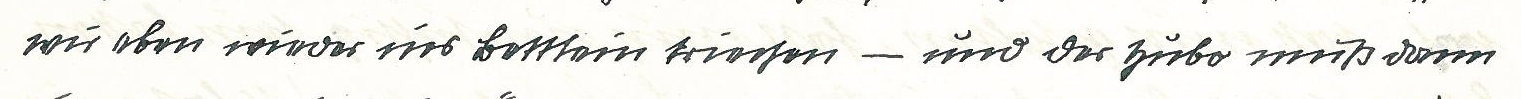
wir oben wieder ins Bettlein kriechen – und der Hubo muß dann
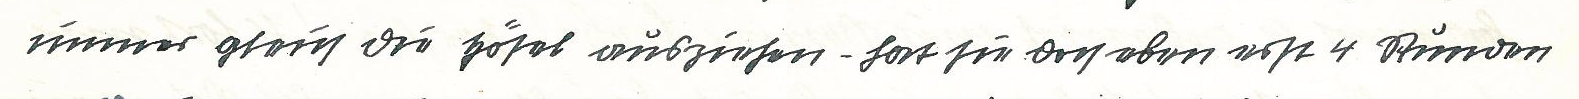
immer gleich die Hösel ausziehen – hat sie doch eben erst 4 Stunden
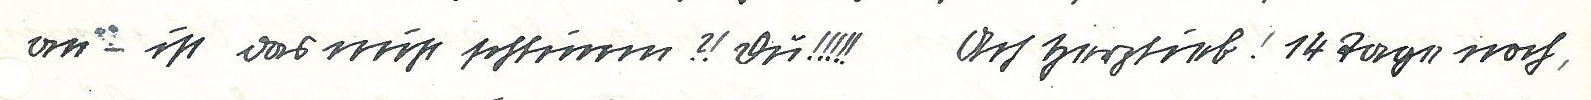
an – ist das nicht schlimm?! Du!!!!! Ach Herzlieb! 14 Tage noch,
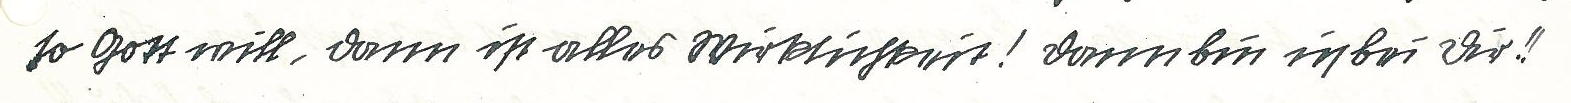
so Gott will, dann ist alles Wirklichkeit! Dann bin ich bei Dir!!
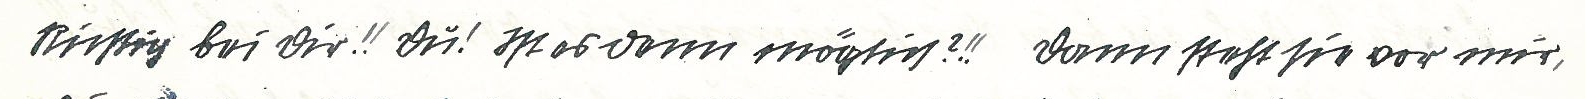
Richtig bei Dir!! Du! Ist es denn möglich?!! Dann steht sie vor mir,
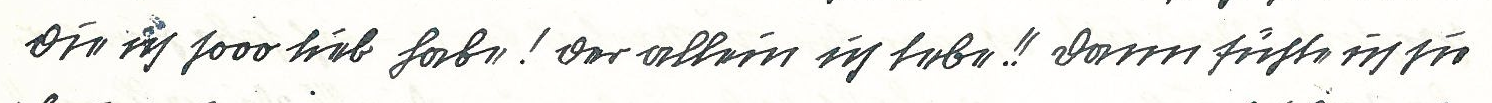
die ich sooo lieb habe! Der allein ich lebe!! Dann fühle ich sie
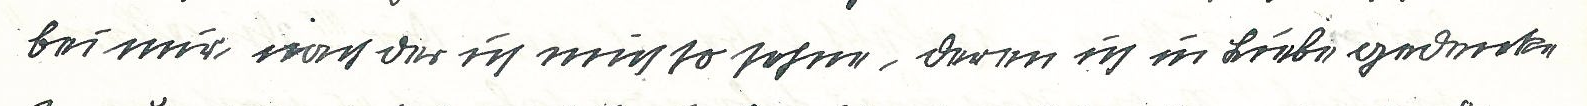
bei mir, nach der ich mich so sehne, deren ich in Liebe gedenke
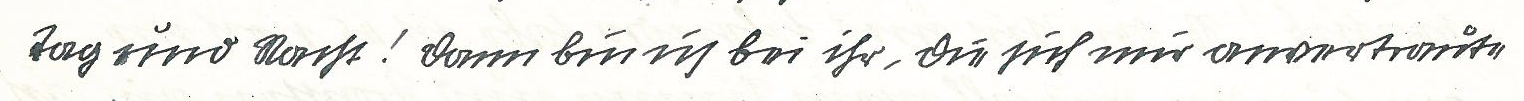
Tag und Nacht! Dann bin ich bei ihr, die sich mir anvertraute
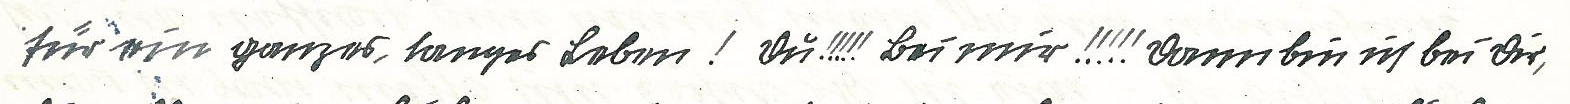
für ein ganzes langes Leben! Du!!!!! Bei mir!!!!! Dann bin ich bei Dir,
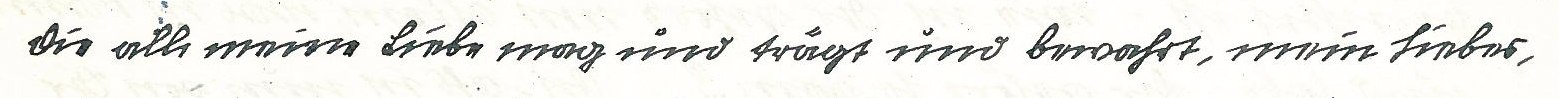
die alle meine Liebe mag und trägt und bewahrt, mein liebes,
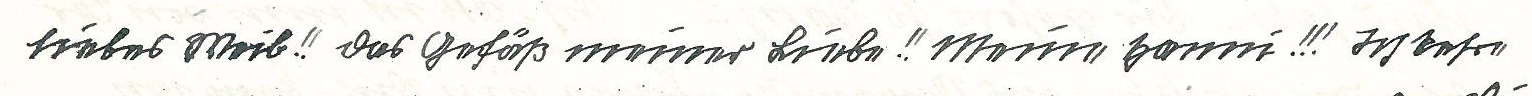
liebes Weib!! Das Gefäß meiner Liebe!! Meine !!! Ich kehre
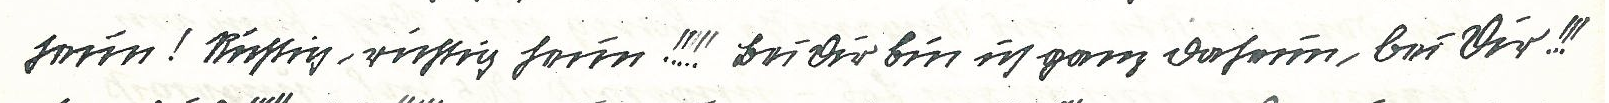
heim! Richtig, richtig heim!!!!! Bei Dir bin ich ganz daheim, bei Dir!!!
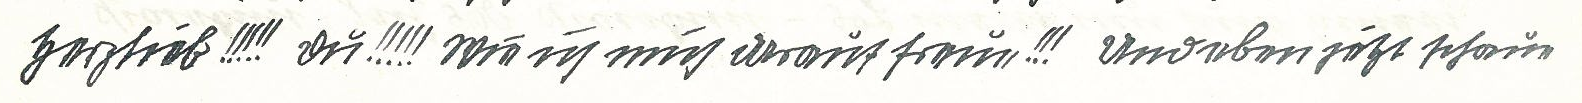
Herzlieb!!!!! Du!!!!! Wie ich mich darauf freue!!! Und eben jetzt schaue
